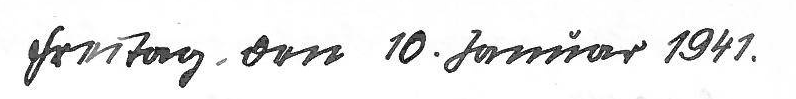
Freitag, den 10. Januar 1941.
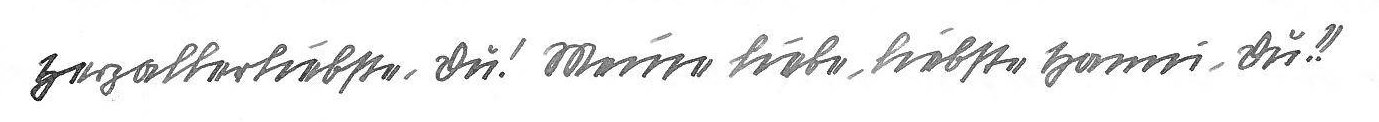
Herzallerliebste, Du! Meine liebe, liebste, Du!!
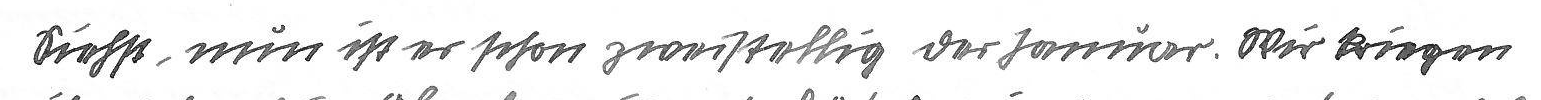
Siehst, nun ist er schon zweistellig der Januar. Wir kriegen
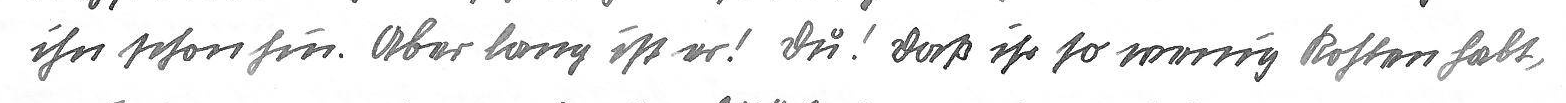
ihn schon hin. Aber lang ist er! Du! Daß ihr so wenig Kohlen habt,
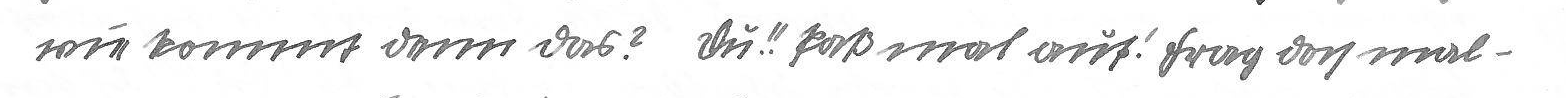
wie kommt denn das? Du!! Paß mal auf! Frag doch mal –
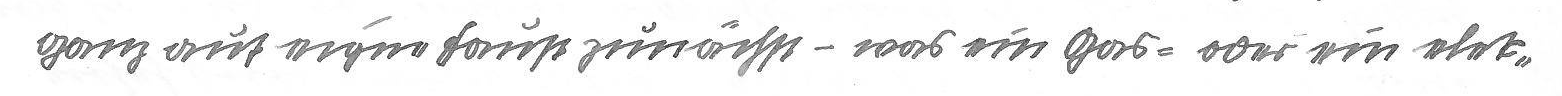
ganz auf eigne Faust zunächst – was ein Gas- oder ein elek¬
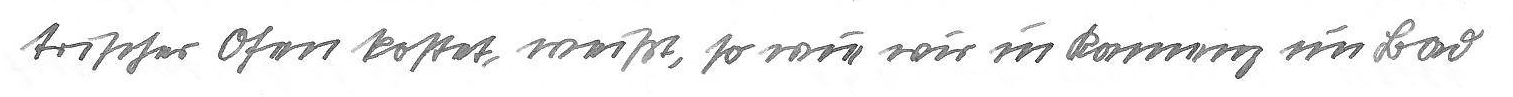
trischer Ofen kostet, weißt, so wie wir in K. im Bad
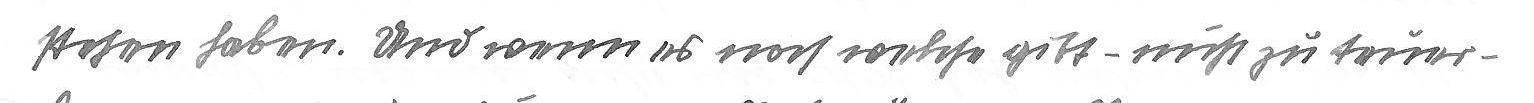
stehen haben. Und wenn es noch welche gibt – nicht zu teuer –
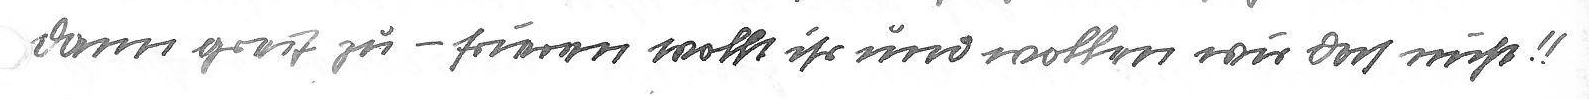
dann greif zu – frieren wollt ihr und wollen wir doch nicht!!
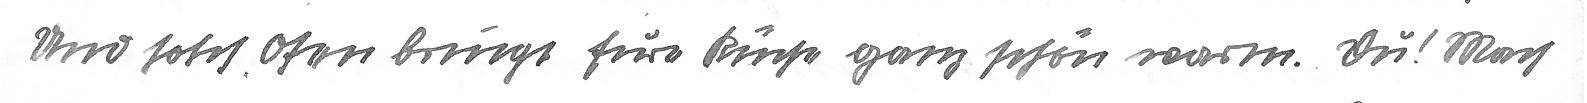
Und solch Ofen bringt Eure Küche ganz schön warm. Du! Mach
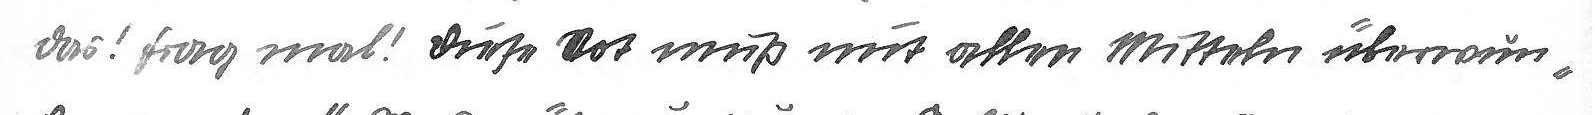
das! Frag mal! Diese Not muß mit allen Mitteln überwun¬
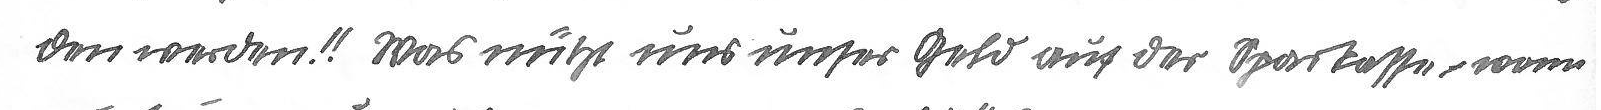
den werden!! Was nützt uns unser Geld auf der Sparkasse, wenn
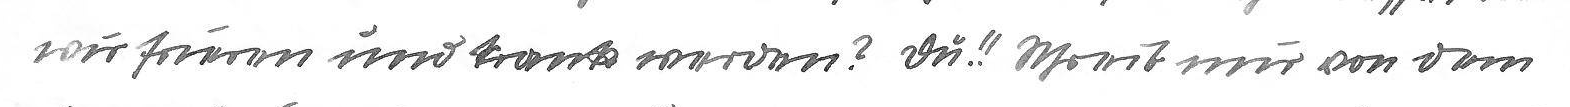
wir frieren und krank werden? Du!! Schreib mir von dem
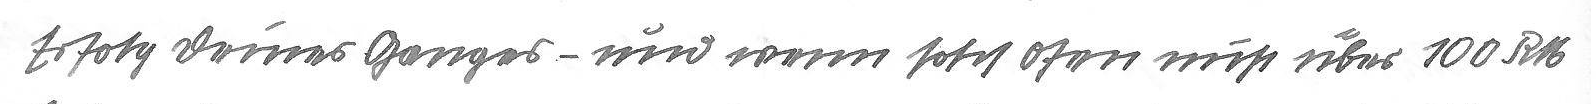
Erfolg Deines Ganges – und wenn solch Ofen nicht über 100 RM
